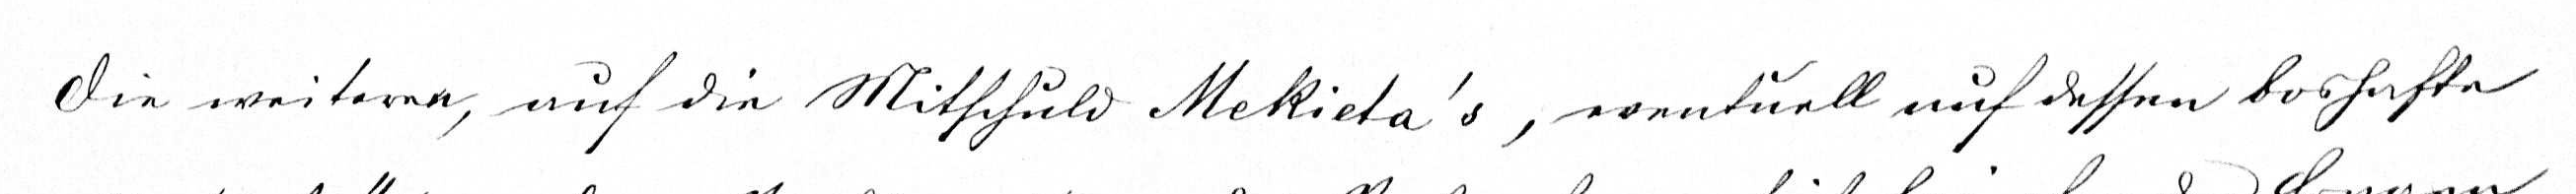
Die weiteren, auf die Mitschuld Mekieta's, wentuell auf dessen boshafte
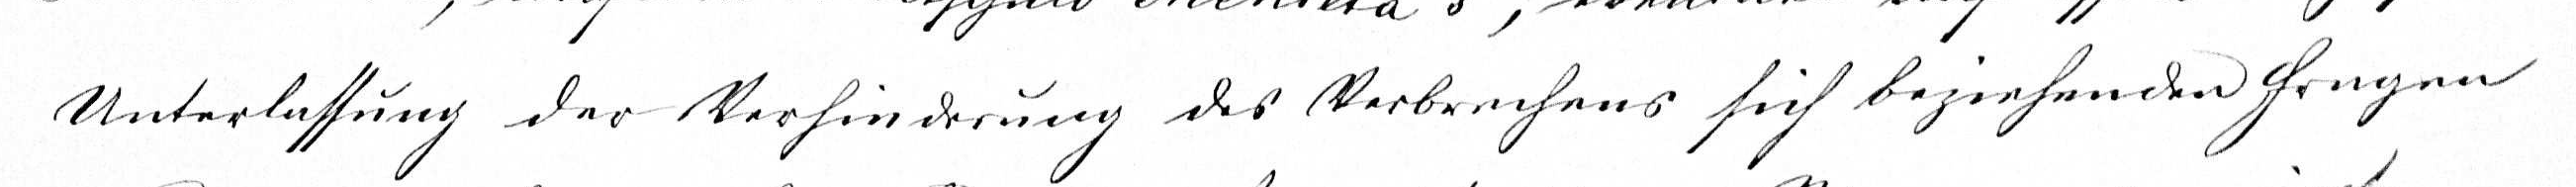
Unterlassung der Verhinderung des Verbrechens sich beziehenden Fragen
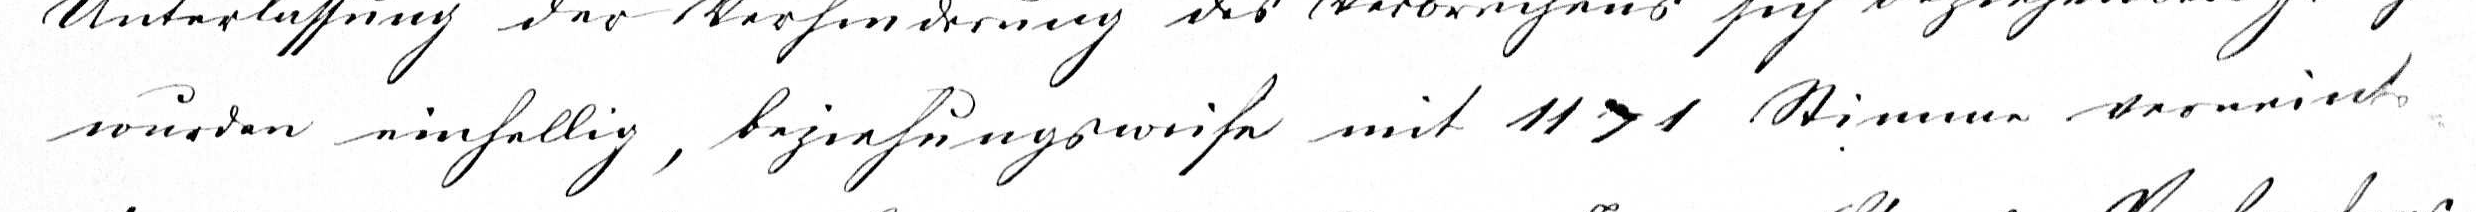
wurden einhellig, beziehungsweise mit 1171 Stimme verneint.
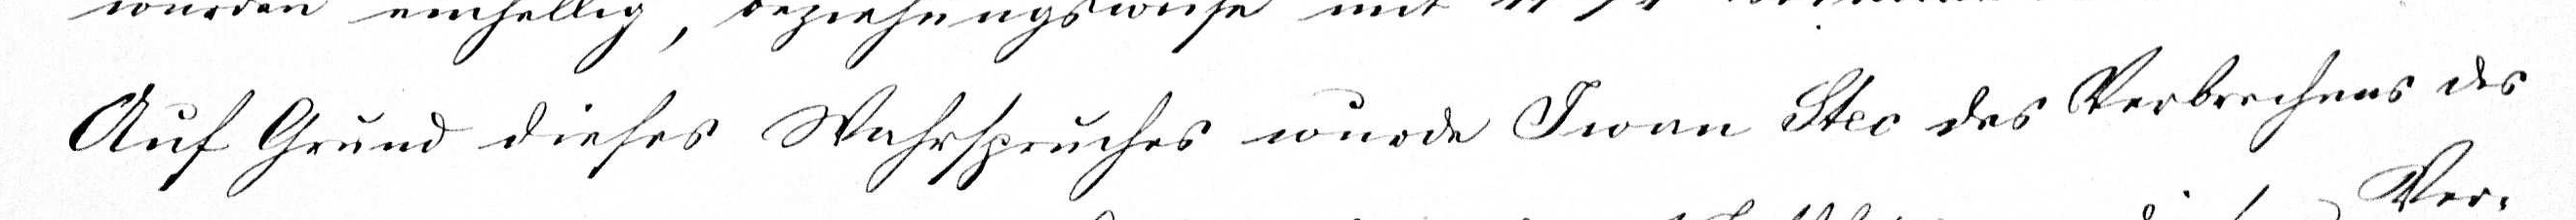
Auf Grund dieses Wahrspruches wurde Jwan Stec des Verbrechens des
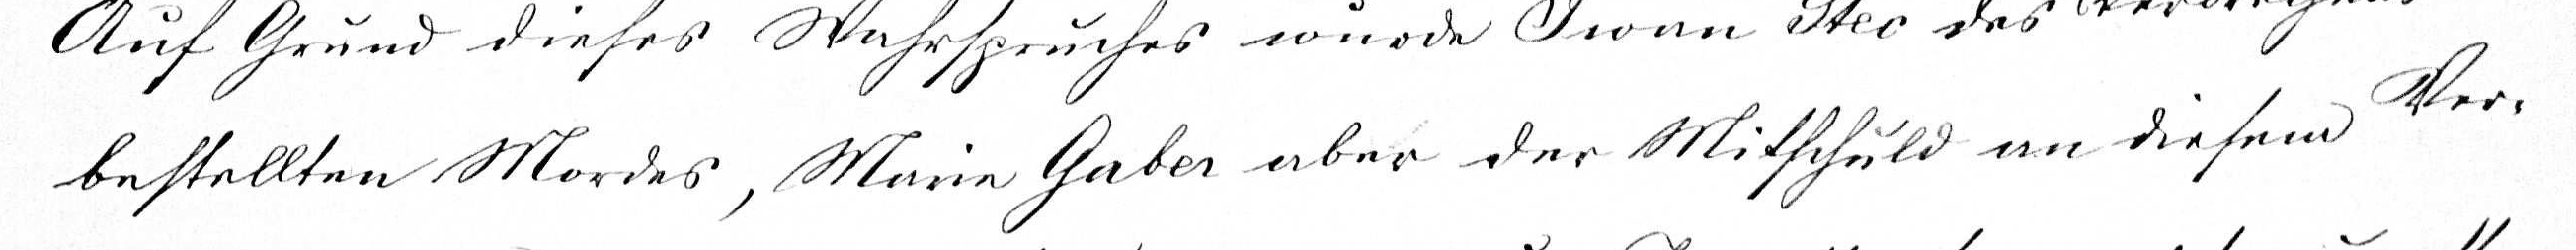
bestellten Mordes, Marie Gaber aber der Mitschuld an diesem Ver¬
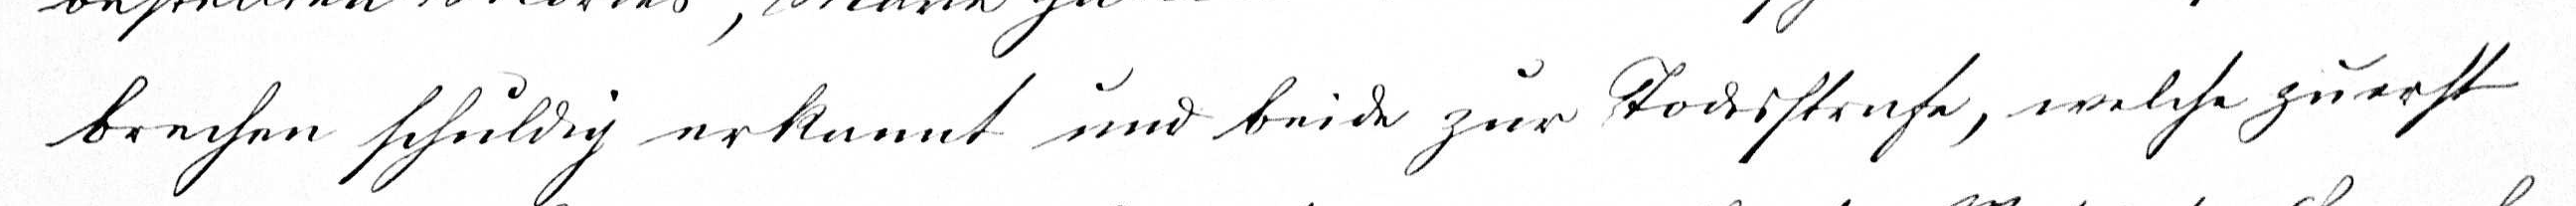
brechen schuldig erkannt und beide zur Todesstrafe, welche zuerst
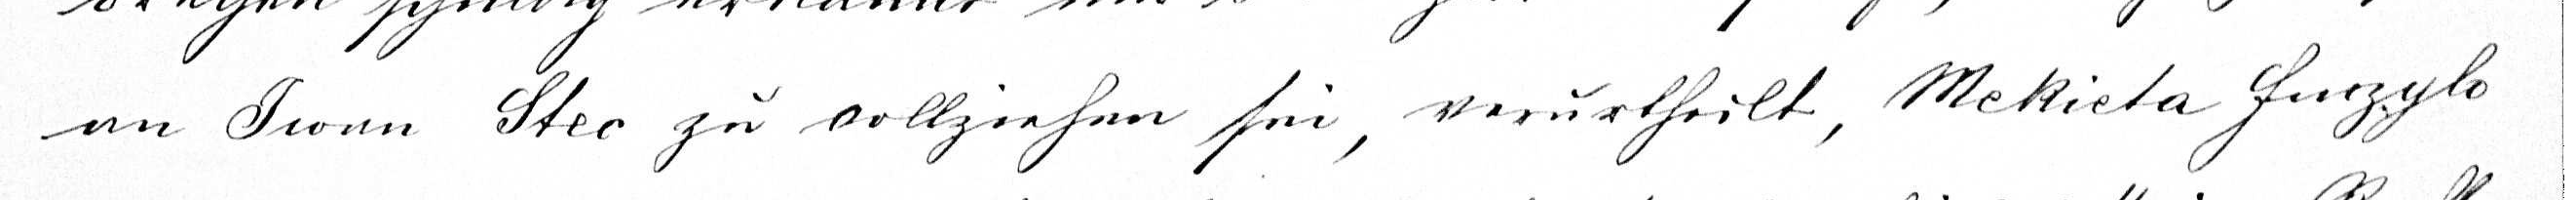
an Jwan Stec zu vollziehen sei, verurtheilt, Mekieta Fuczylo
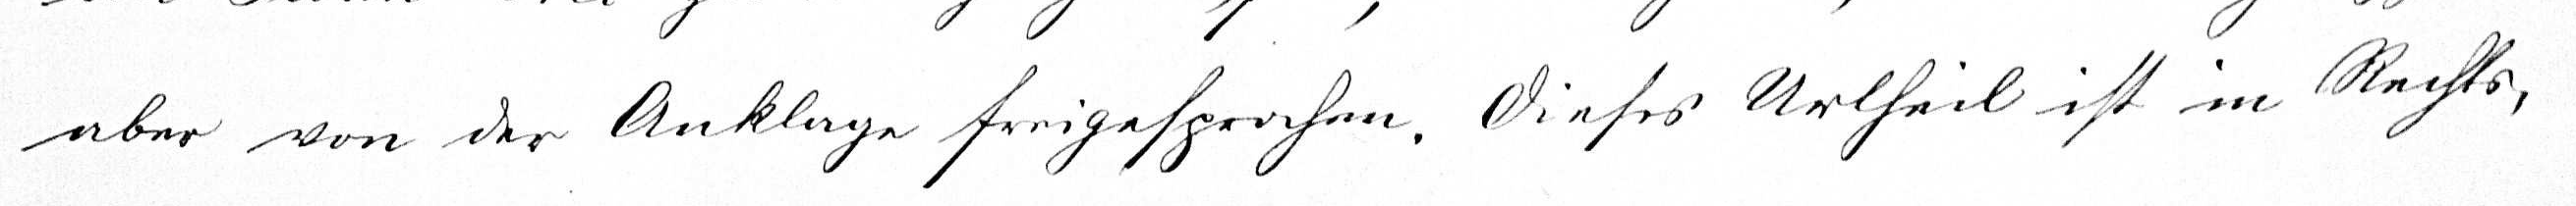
aber von der Anklage Freigesprochen. Dieses Urtheil ist in Rechts¬
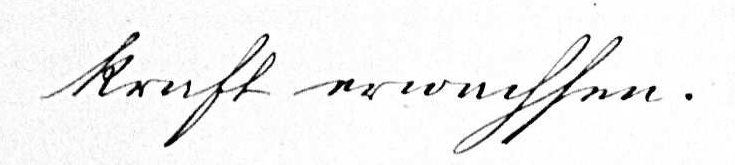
kraft erwachsen.
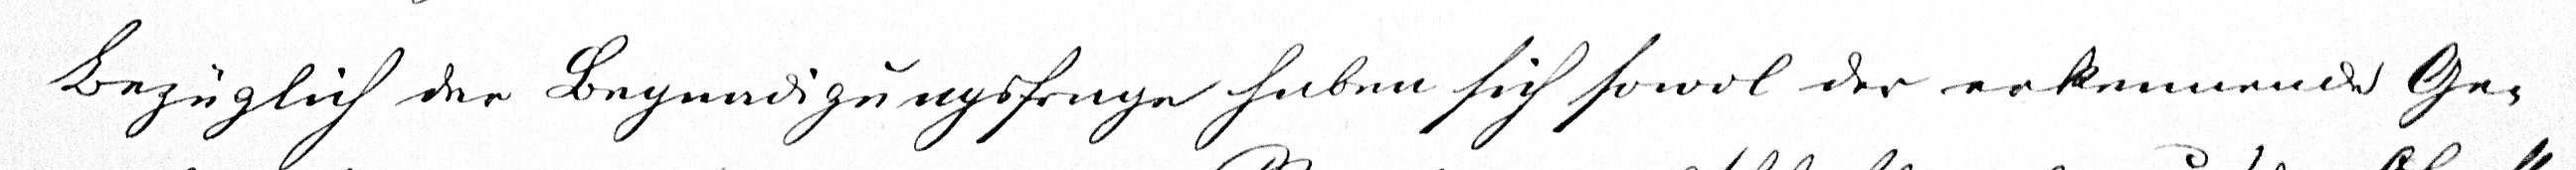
Bezüglich der Begnadigungsfrage haben sich sowol der erkennende Ge¬
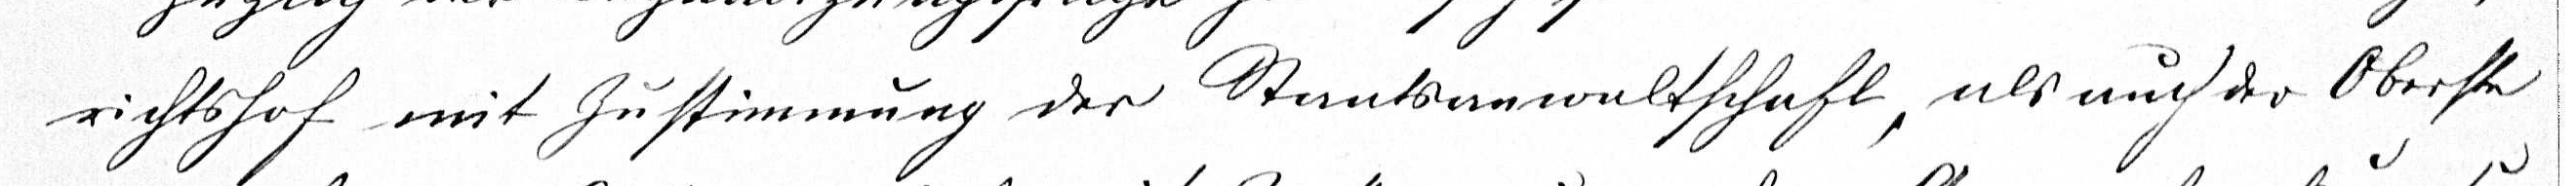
richtshof mit Zustimmung der Staatsanwaltschaft, als auch der Oberste
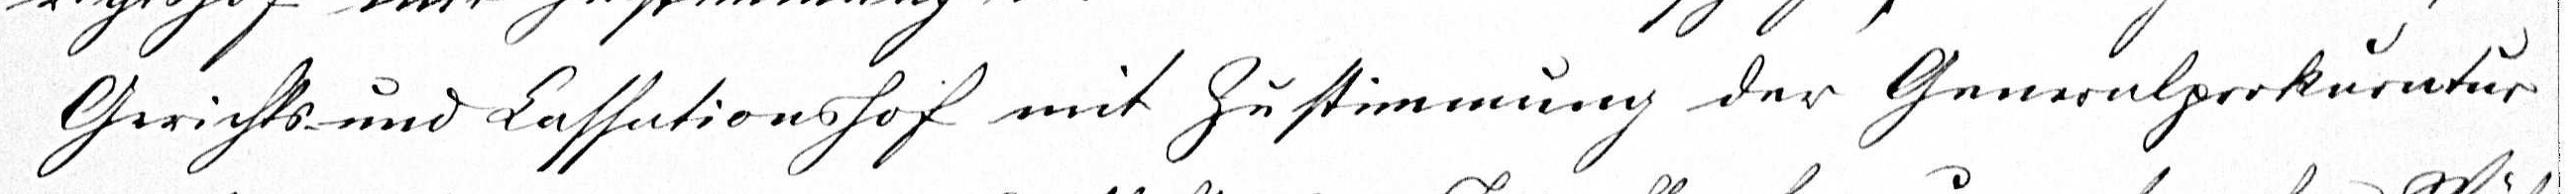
Gerichts- und Cassationshof mit Zustimmung der Generalprokuratur
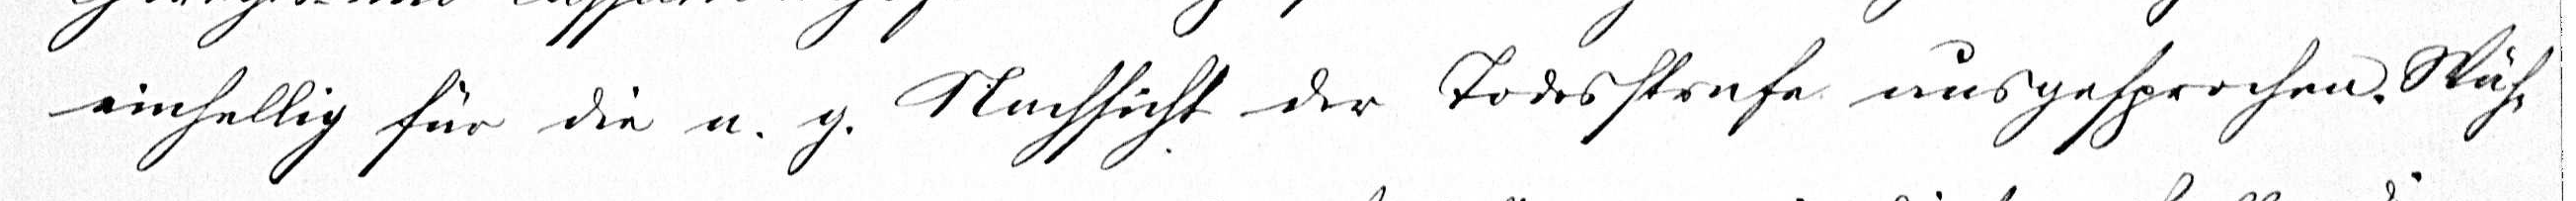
einhellig für die a. g. Nachsicht der Todesstrafe ausgesprochen. Näh¬
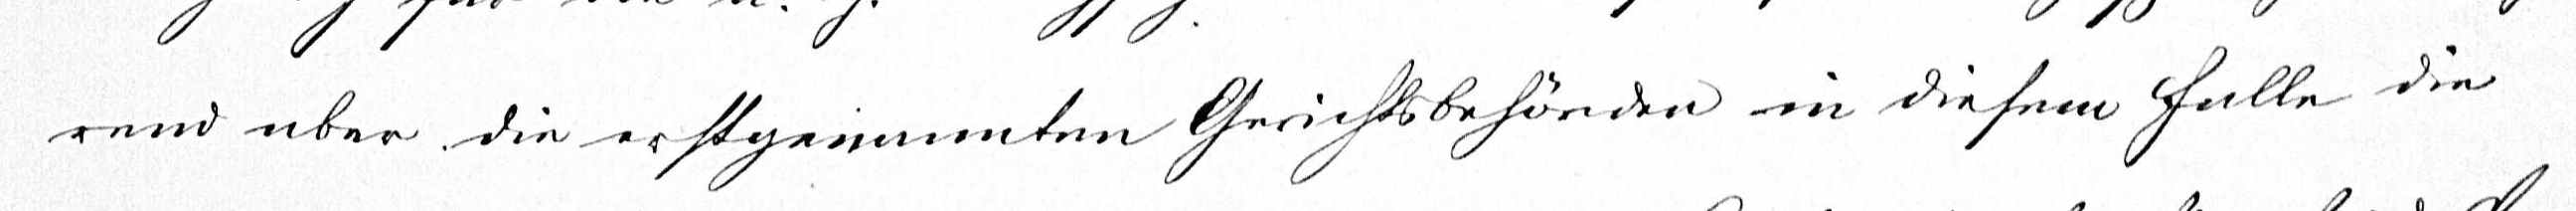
rend aber die erstgenannten Gerichtsbehörden in diesem Falle die
